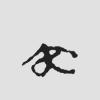夭
